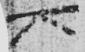亓（其）
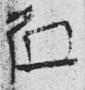凥
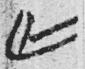亡
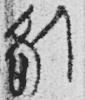咎
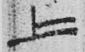上
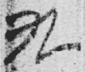九
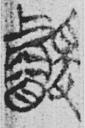○（渙）
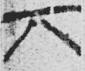亓（其）
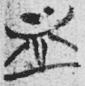血
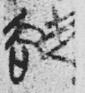欲
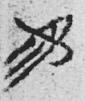易
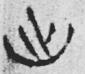出
